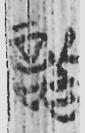詣
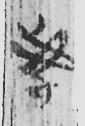我
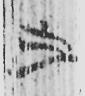之
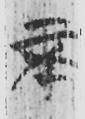不
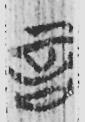言
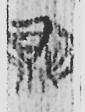則
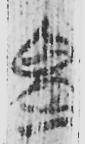畏
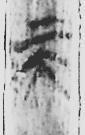天
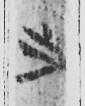之
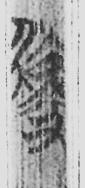發
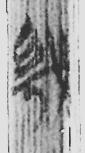幾
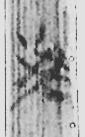我
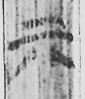亓
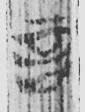言
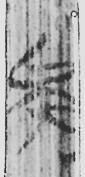矣
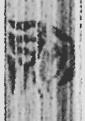則
